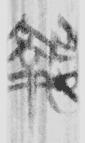執
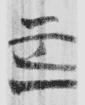正
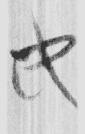女
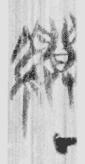{糸興}
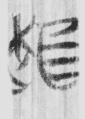𧻚
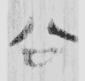公
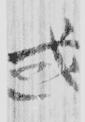或
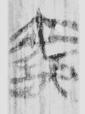{尒䎽}
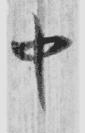中
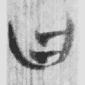曰
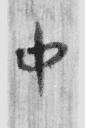中
